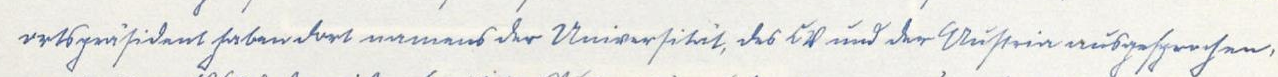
ortspräsident haben dort namens der Universität, des CV und der Austria ausgesprochen,
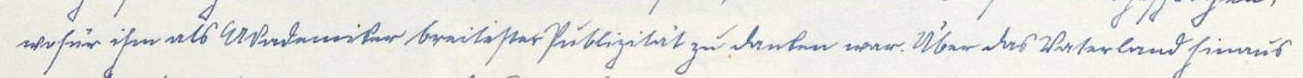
wofür ihm als Akademiker bereitester Publizität zu danken war. Über das Vaterland hinaus
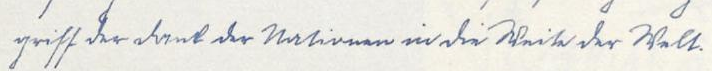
griff der Dank der Nationen in die Weite der Welt.
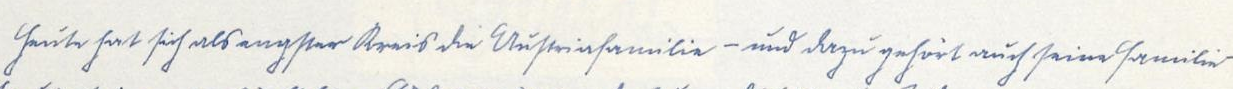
Heute hat sich als engster Kreis die Austriafamilie - und dazu gehört auch seine Familie –
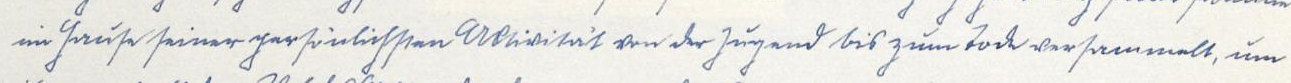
im Haus seiner persönlichsten Aktivität von der Jugend bis zum Tode versammelt, um
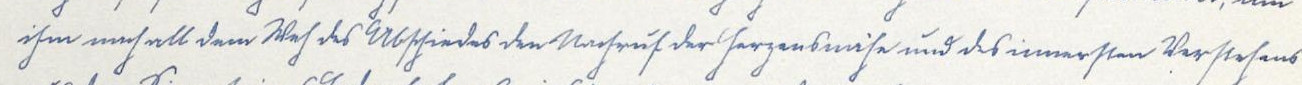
ihm nach all dem Weh Abschieds den Nachruf der Herzensnähe und des innersten Verstehens
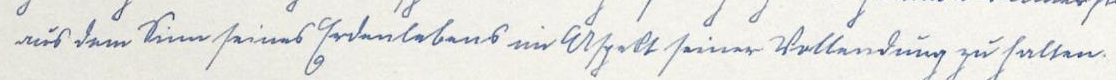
aus dem Sinn seines Erdenlebens im Aspekt seiner Vollendung zu halten.
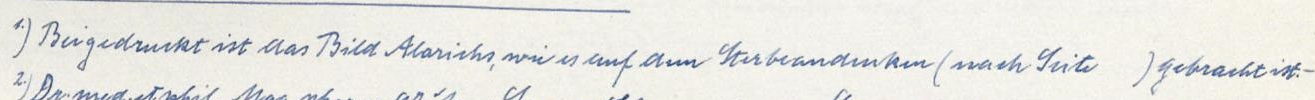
1) Beigedruckt ist das Bild Alarichs, wie es auf dem Sterbeandenken (nach Seite) gebracht ist.-
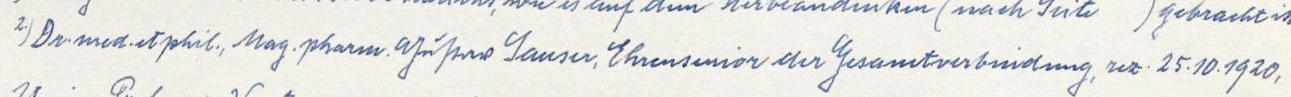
2) Dr. med. et phil. Mag. pharm Gustav Sauser, Ehrensenior der Gesamtverbindung, rez. 25.10.1920,
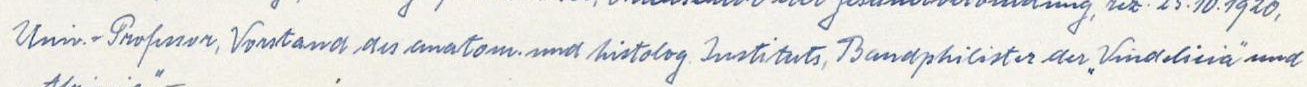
Univ.-Professor, Vorstand des anatom. und histolog. Instituts, Bandphilister der „Vindelicia“ und
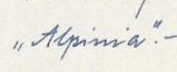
„Alpinia“.-
